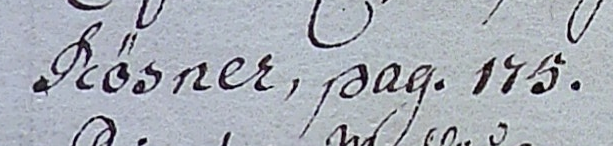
Rösner, pag. 175.
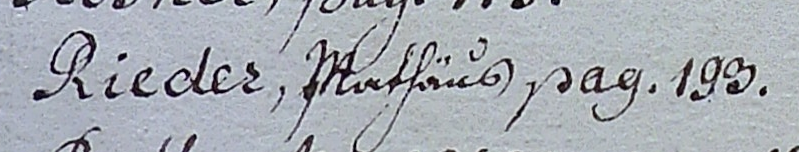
Rieder, Mathäus pag. 193.
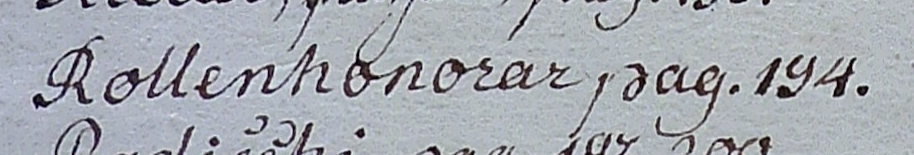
Rollenhonorar pag. 194.
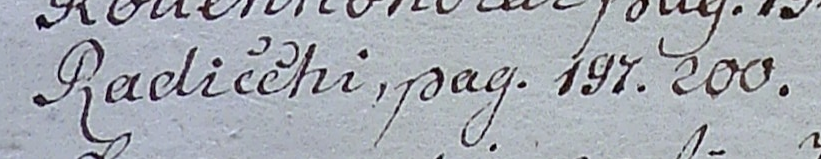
Radicchi, pag. 197. 200.
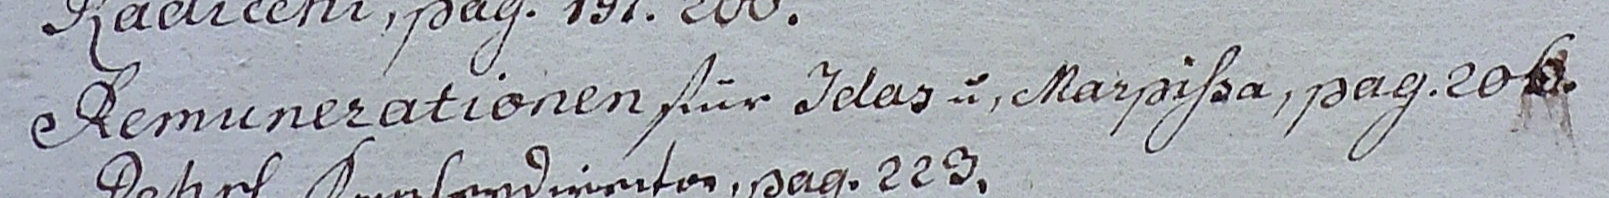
Remunerationen für Idas u, Marpissa, pag. 206.
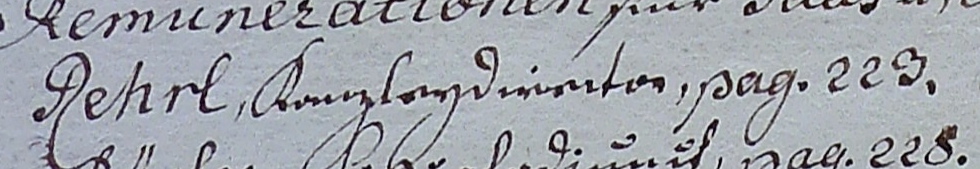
Rehrl, Kanzleydirector, pag. 223.
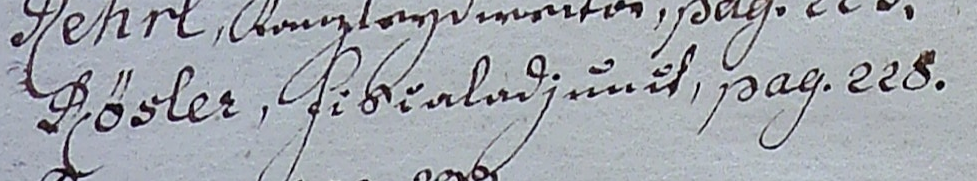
Rösler, Fiscaladjunct, pag. 228.
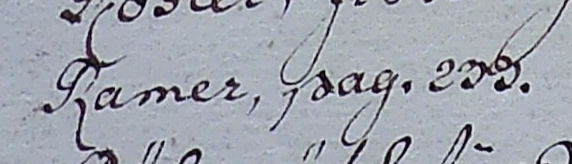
Ramer, pag. 233.
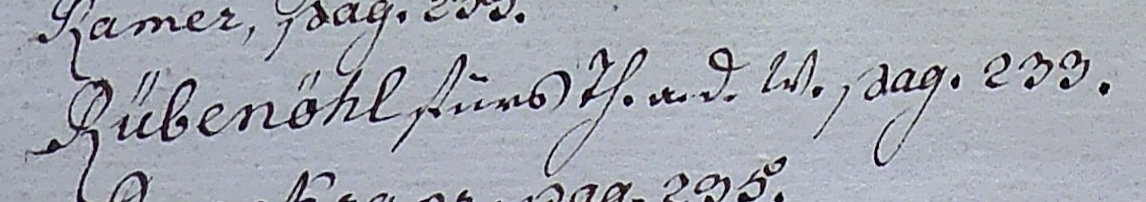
Rübenöhl fürs Th. a. d. W., pag. 233.
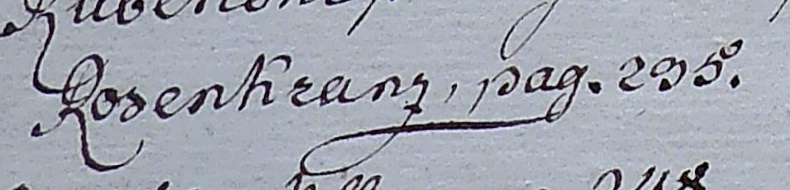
Rosenkranz, pag. 235.
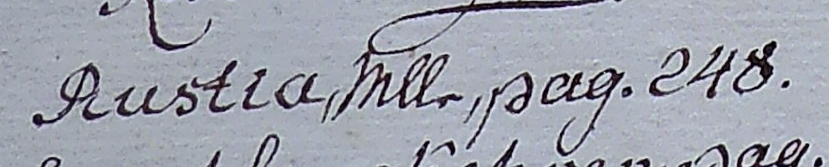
Rustia, Mlle, pag. 248.
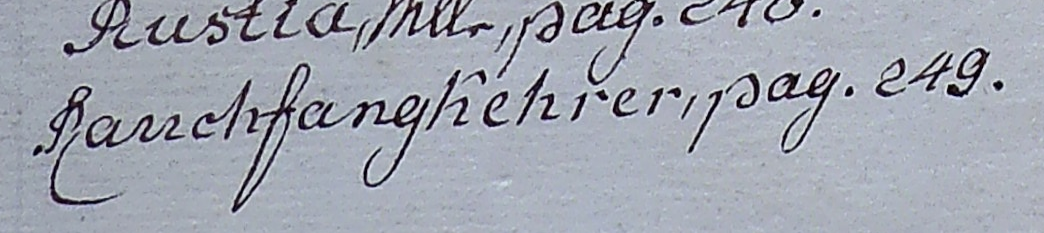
Rauchfangkehrer, pag. 249.
